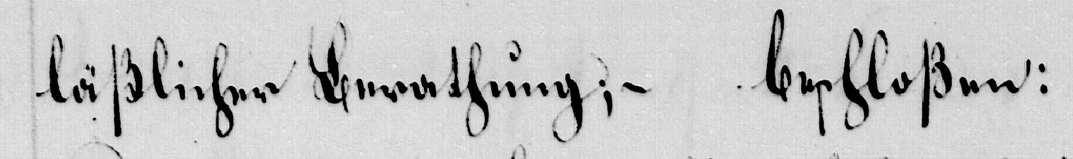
läßlicher Berathung, – beschloßen:
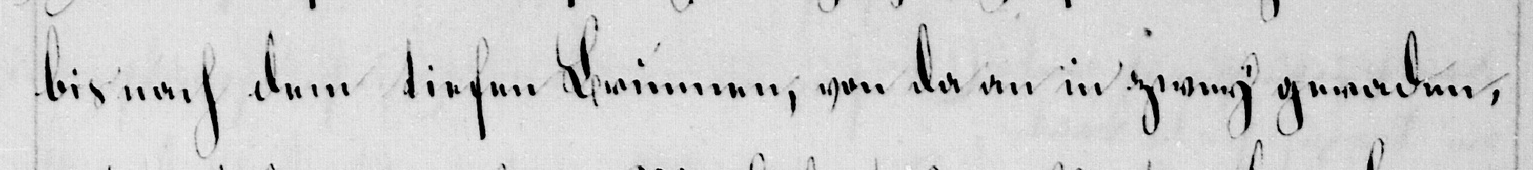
bis nach dem tiefen Brunnen, von da an in zwey geraden,
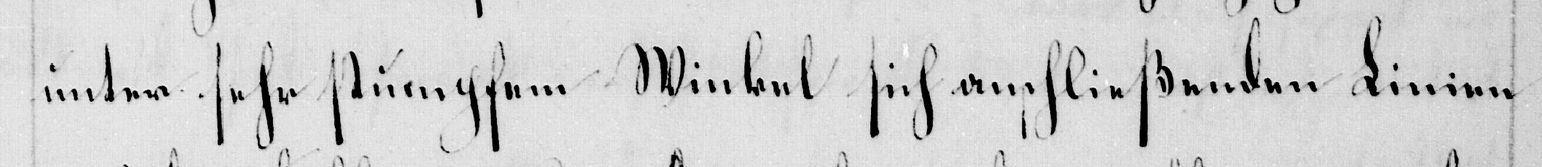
unter sehr stumpfem Winkel sich anschließenden Linien
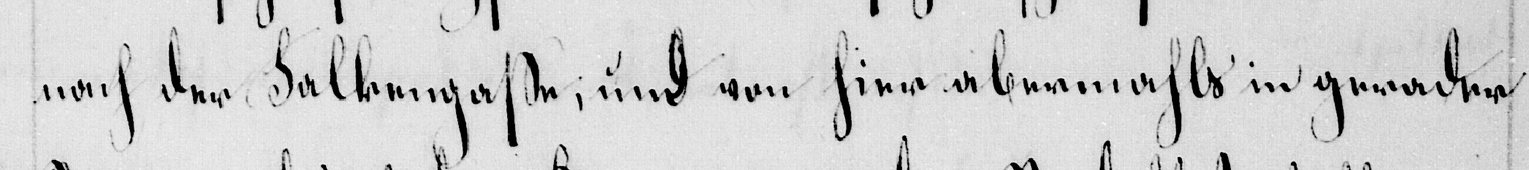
nach der Falkengaße, und von hier abermahls in gerader
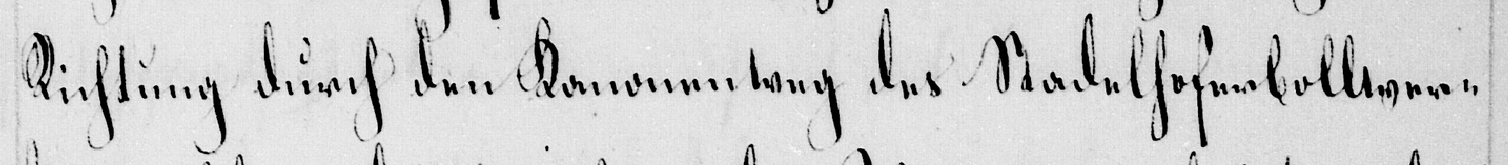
Richtung durch den Kanonenweg des Stadelhoferbollwer¬
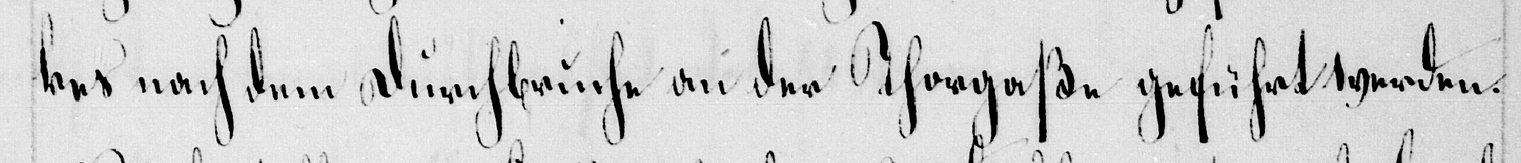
kes nach dem Durchbruche an der Chorgaße geführt werden.
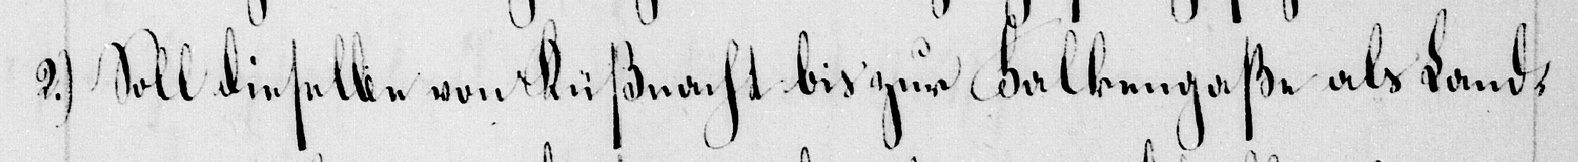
2.) Soll dieselbe von Küßnacht bis zur Falkengaße als Lands¬
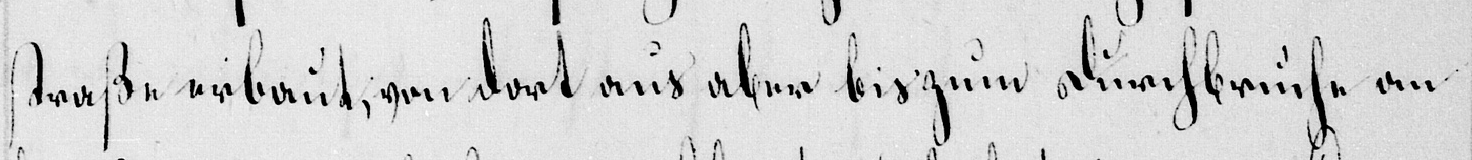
traße erbaut, von dort aus aber bis zum Durchbruche an
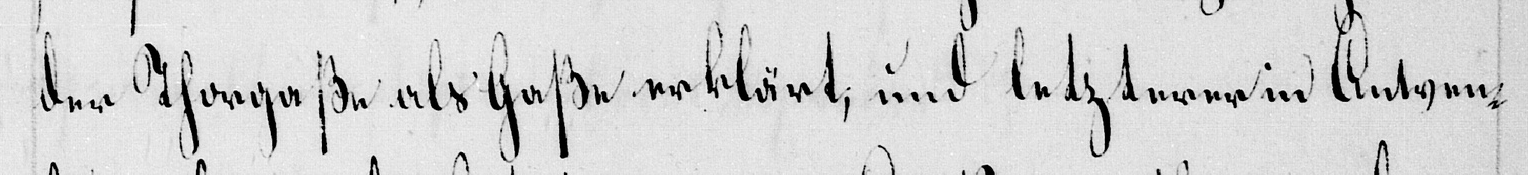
der Chorgaße als Gaße erklärt; und letzterer in Anwen¬
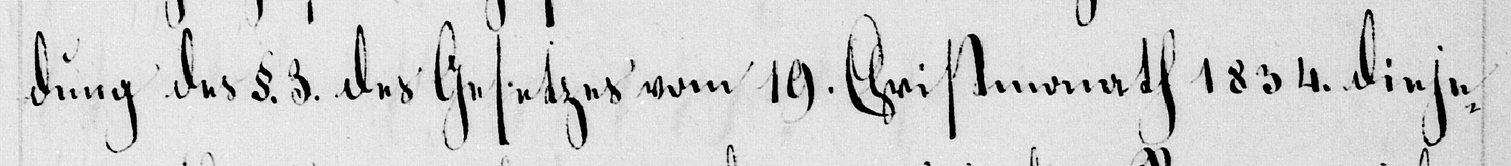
dung des §. 3. des Gesetzes vom 19. Christmonath 1834. dieje¬
